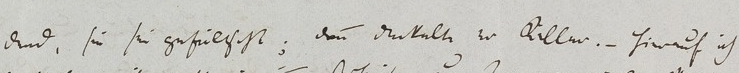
dend, sie sei gefälscht; dann deckelte er Keller. – Hierauf ich
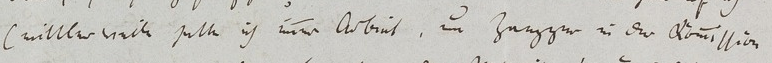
(mittler weile hatte ich immer Arbeit, um Zangger in der Kommission
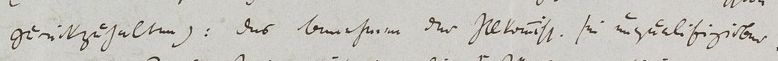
zurückzuhalten): das Benehmen der Illkommiss. sei unqualifizirbar;
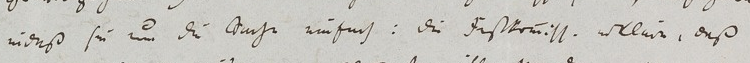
indeß sei nun die Sache einfach: die Festkommiss. erkläre, daß
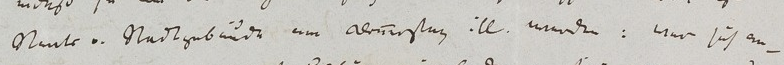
Staats &. Stadtgebäude am Donnerstag ill. werden: wer sich an-
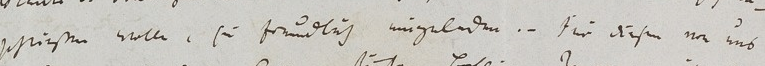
schließen wolle, sei freundlich eingeladen. – Für diesen von uns
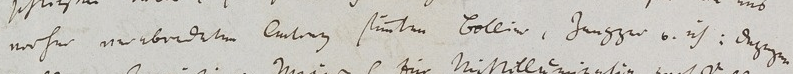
vorher verabredeten Antrag stimmten Bollier, Zangger &. ich: dagegen
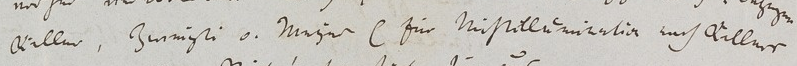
Keller, Zwingli &.Meyer (für Nichtillumination nach Kellers
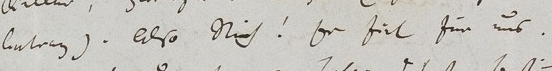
Antrag). Also Stich! Er fiel für uns.
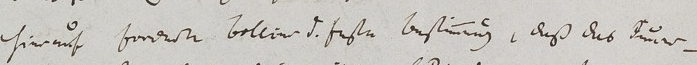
Hierauf forderte Bollier d. feste Bestimmung, daß das Feuer-
